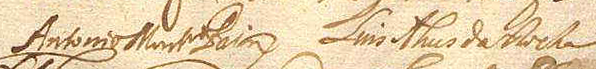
Antonio Montro Paim Luis Alues da Rocha
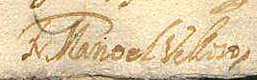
Fr. Manoel Vellozo
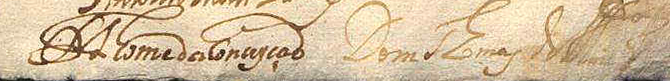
Thome da Conceyçaõ Dom Thomas do M
